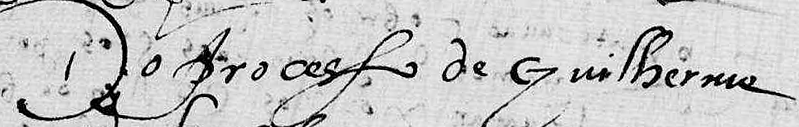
Do processo de Guilherme
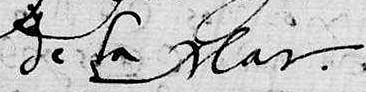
de la Mar.
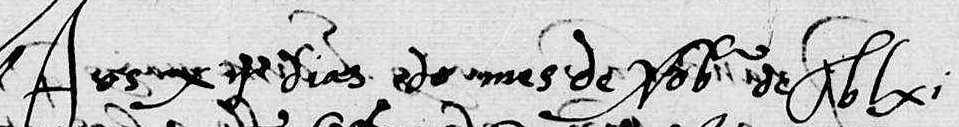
Aos xij dias do mes de Nobro de j̄ blxi
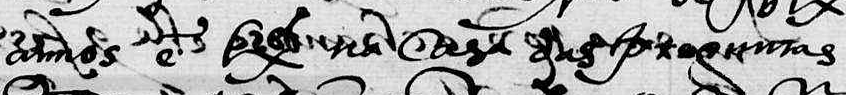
annos ē Lx na casa das preguntas
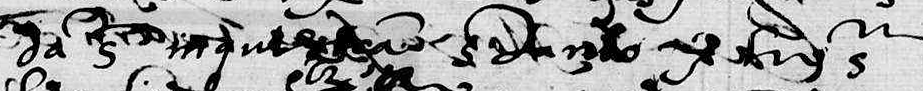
da sta inquisiçaõ stando y ho sor
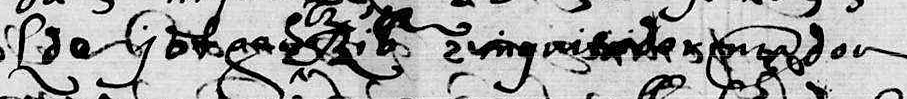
Ldo jorge Ribro inquisidor mādou
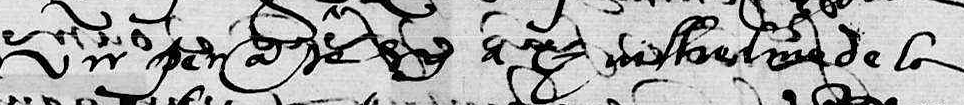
vir perāte sy a guilherme de la
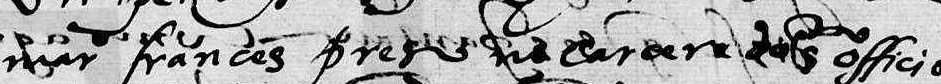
mar frances preso no carcere do sto officio
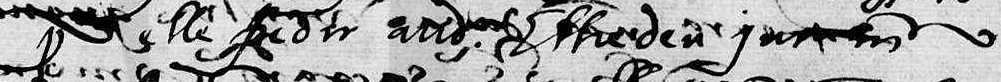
p̄o elle pedir aud.a E lhe deu juramto
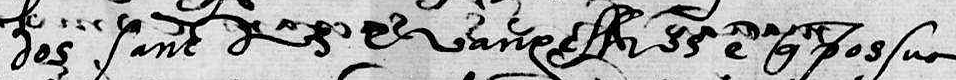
dos sanctos evangelhos e̅ q̅ pos sua
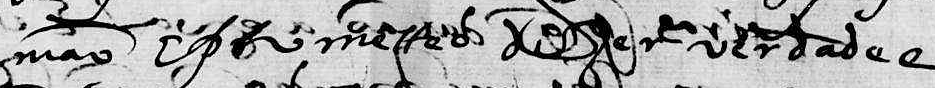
mão E prometteo dizer verdade e
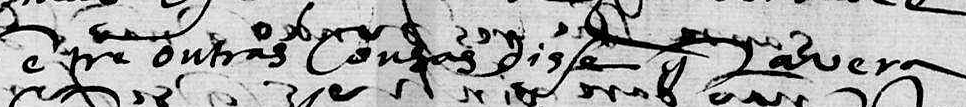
ētre outras Cousas dise q̄ havera
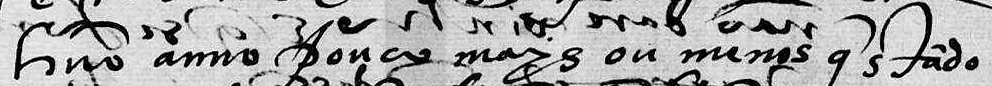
huo anno pouco mais ou menos q̄ stādo
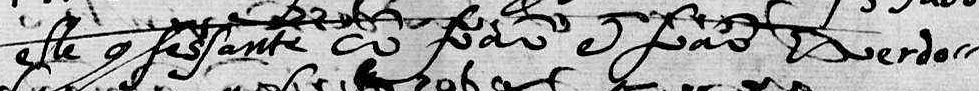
elle ꝯfessante cō foaõ e foaõ E verdo
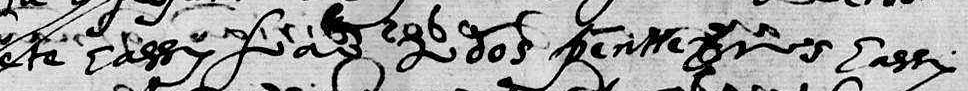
lete E assy foaõ todos pēntteyros E assy
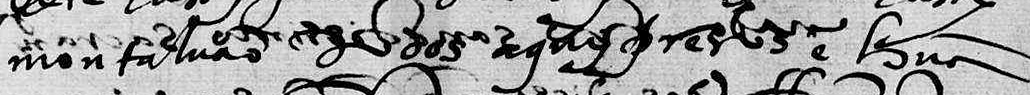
montaluaõ todos aquy presos ē huā
